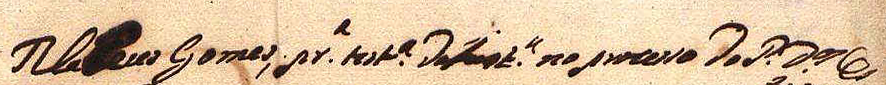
Ma_eus Gomes, pr.a test.a da Iust.a no processo do P. d.os Es
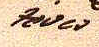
teves
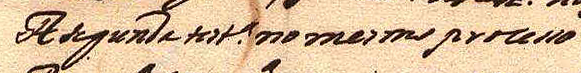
A segunda test.a no mesmo processo
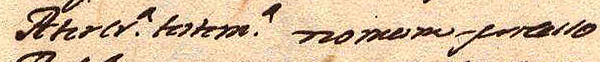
A tercr.a testem.a no mesm- porcesso
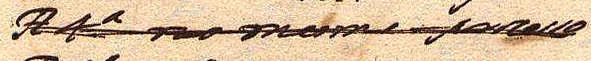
A 4a no mesmo porcesso
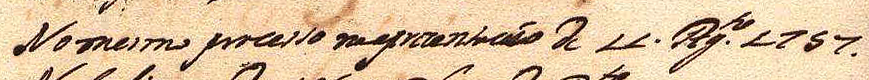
No mesmo processo na aprezentação de 11. Ag.to 1757.
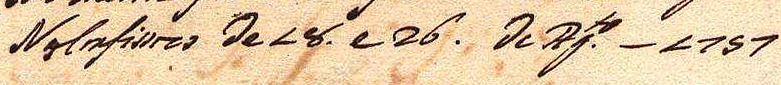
Nas Confissoes de 18. e 26. de Ag.to - 1757
